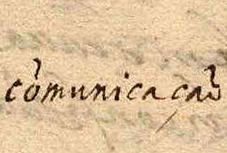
cōmunicaçaõ
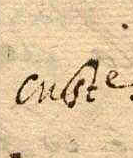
custe
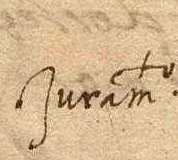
Jurāmto
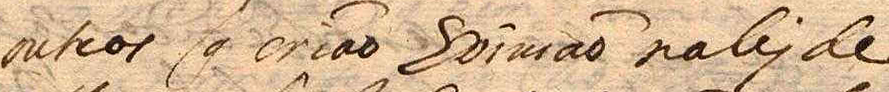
outros q̄ crião E viuiaõ na lej de
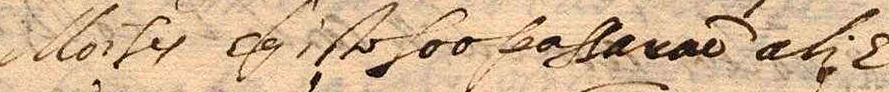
Moises E q̄ isto soo passaraõ ali E
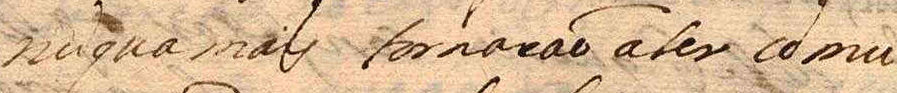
nūqua mais tornaraõ a ter cōmu
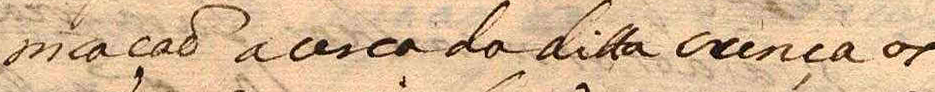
nicaçaõ acerca da ditta crença os
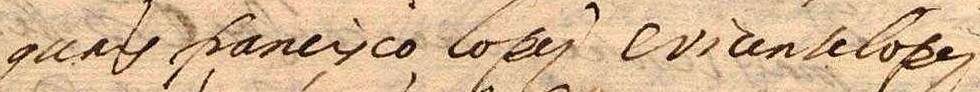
quais françisco lopez e vicente lopez
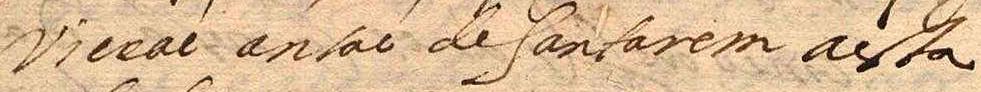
Vieraõ antaõ de Santarem a esta
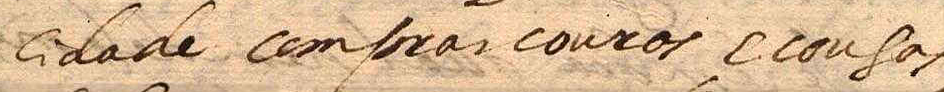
cidade comprar couros E cousas
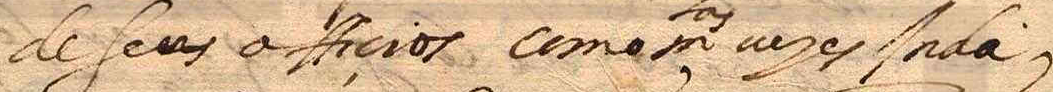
de seus offiçios como mtas vezes Jnda
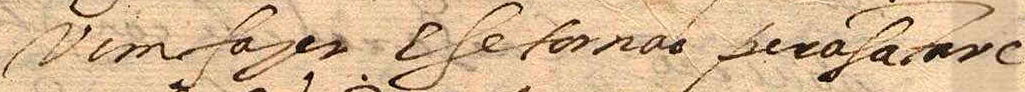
Vem fazer E se tornaõ pera sātarē
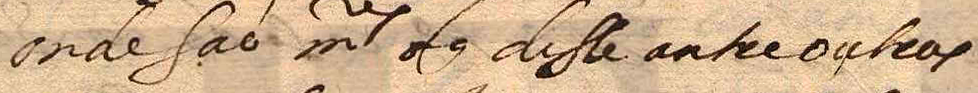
onde saõ mres o q̄ disse antre outras
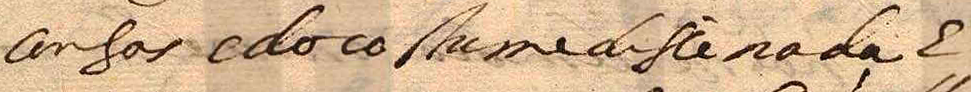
cousas e do costume disse nada E
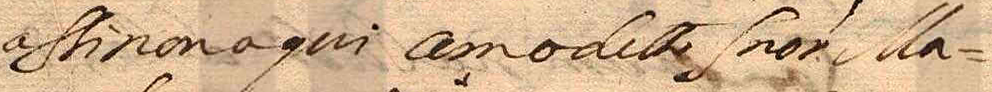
assinou aqui com o ditto Snor̄ Ma
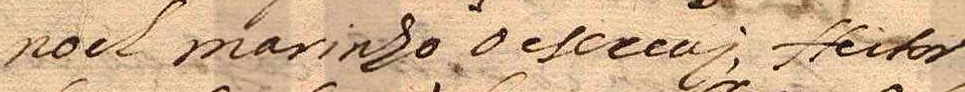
noel marinho o escreuj, Heitor
